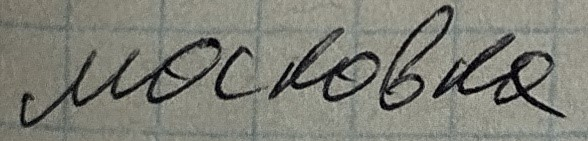московка
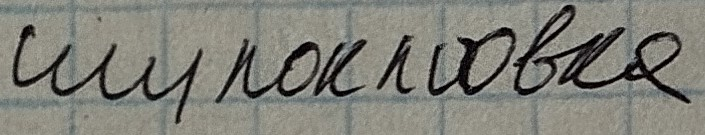шилоклювка
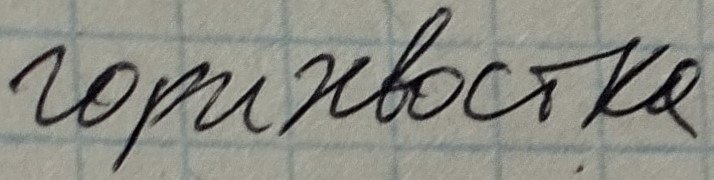горихвостка
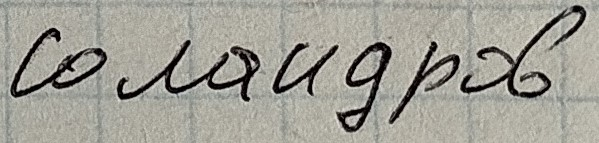соландров
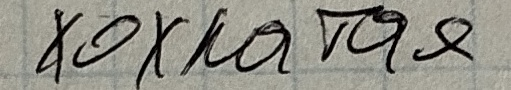хохлатая
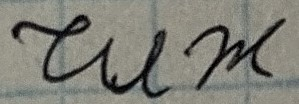чиж
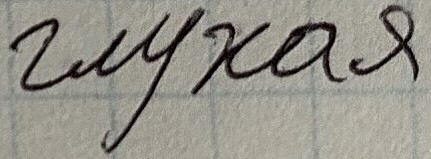глухая
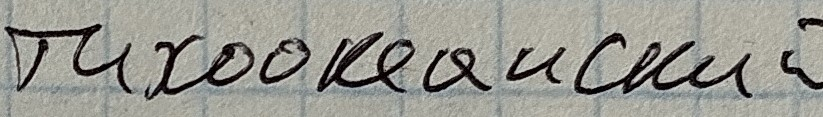тихоокеанский
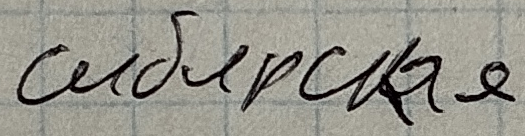сибирская
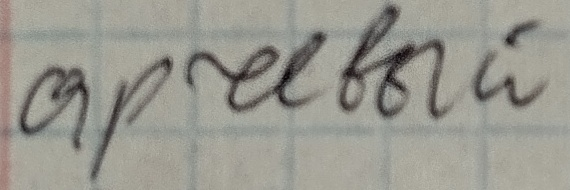арчевый
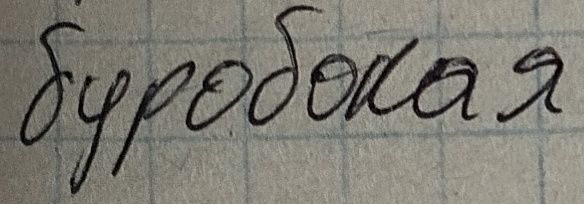буробокая
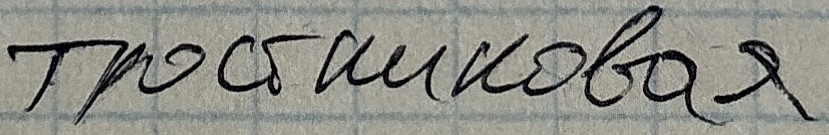тростниковая
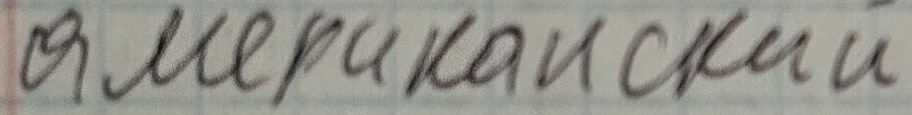американский
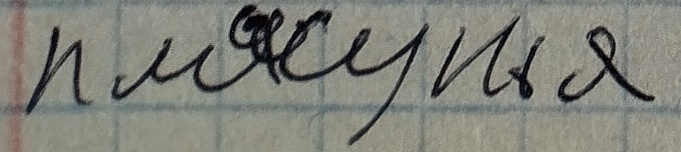плясунья
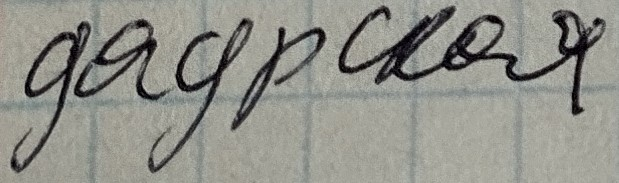даурская
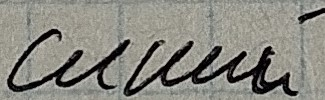синий
